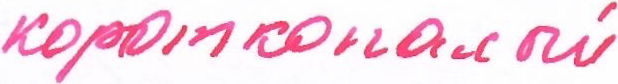короткопалый
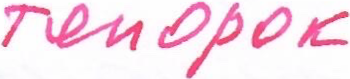топорок
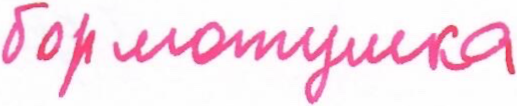бормотушка
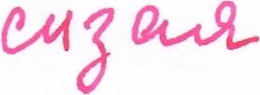сизая
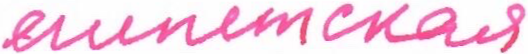египетская
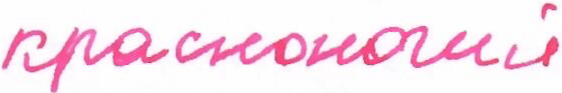красноногий
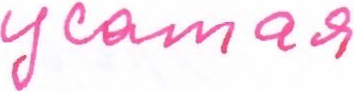усатая
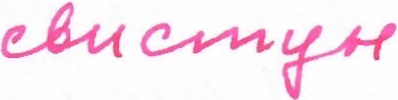свистун
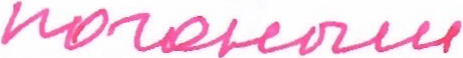погоныш
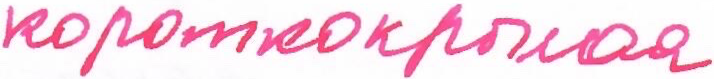короткокрылая
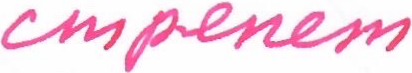стрепет
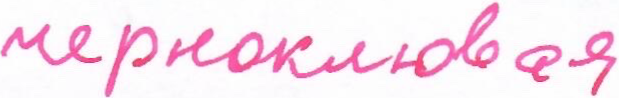черноклювая
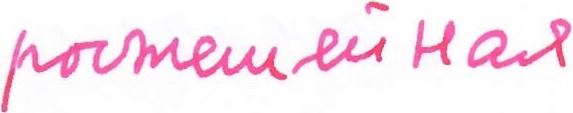рыжешейная
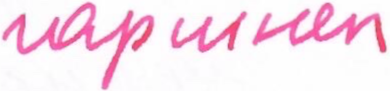гаршнеп
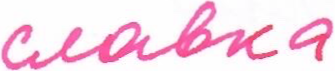славка
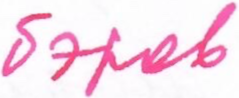бэров
